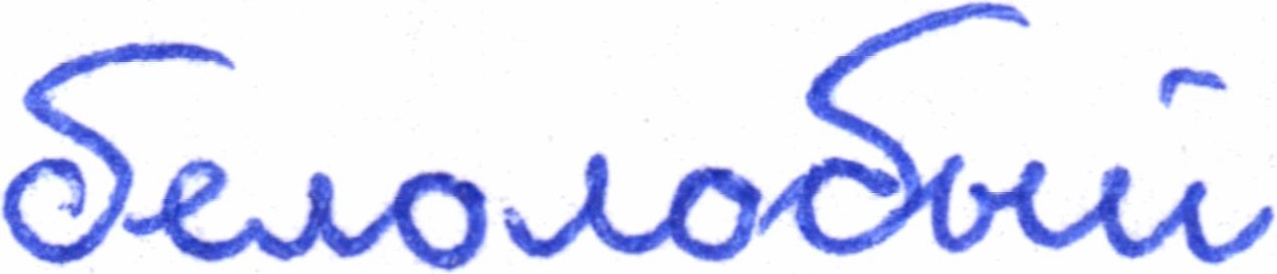белолобый
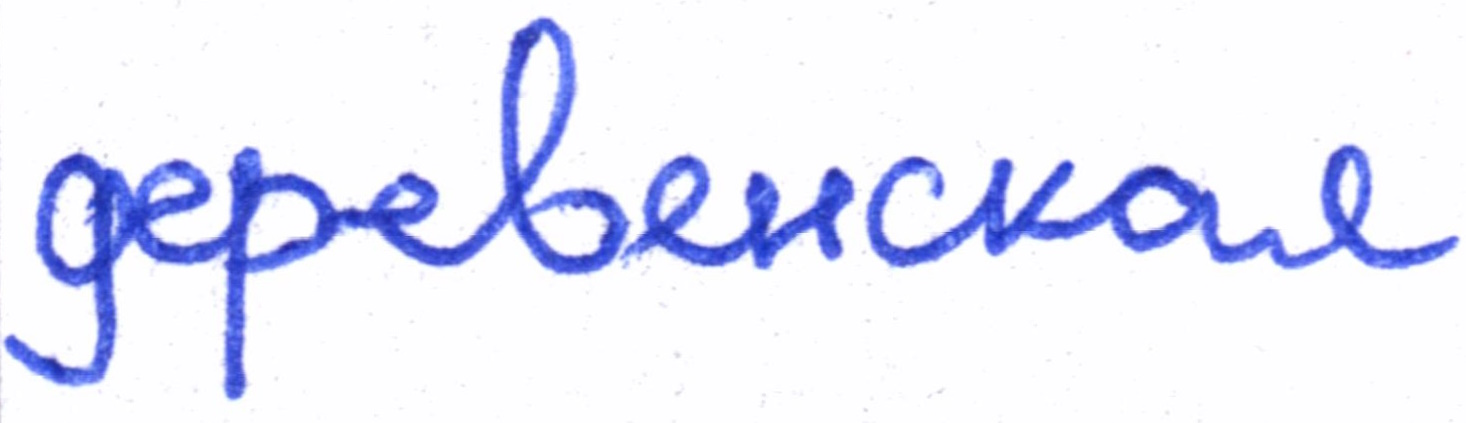деревенская
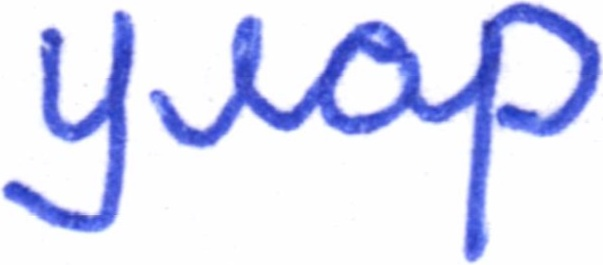улар
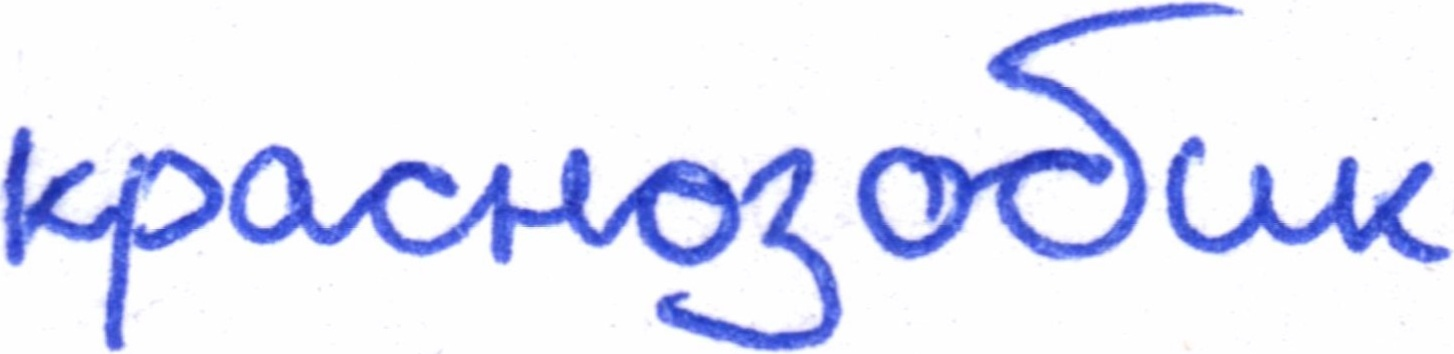краснозобик
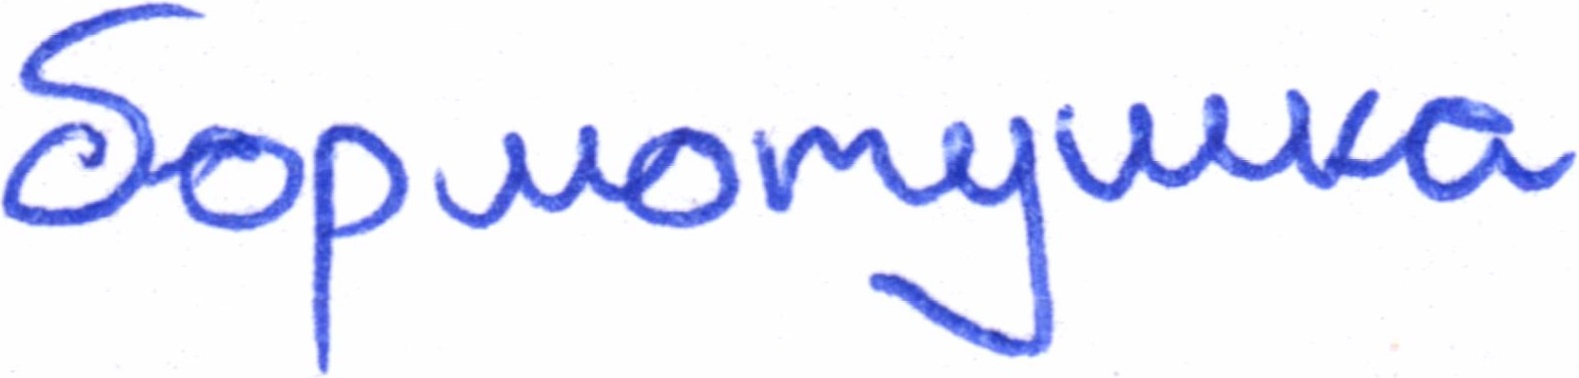бормотушка
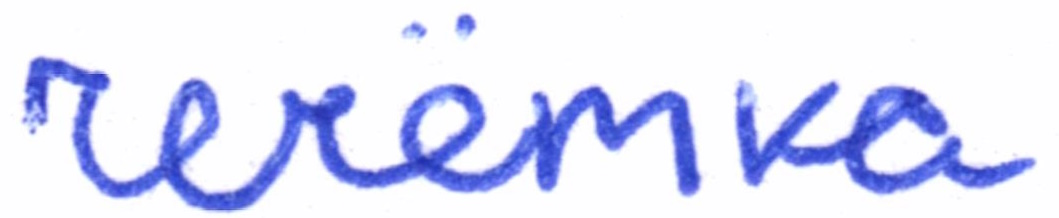чечётка
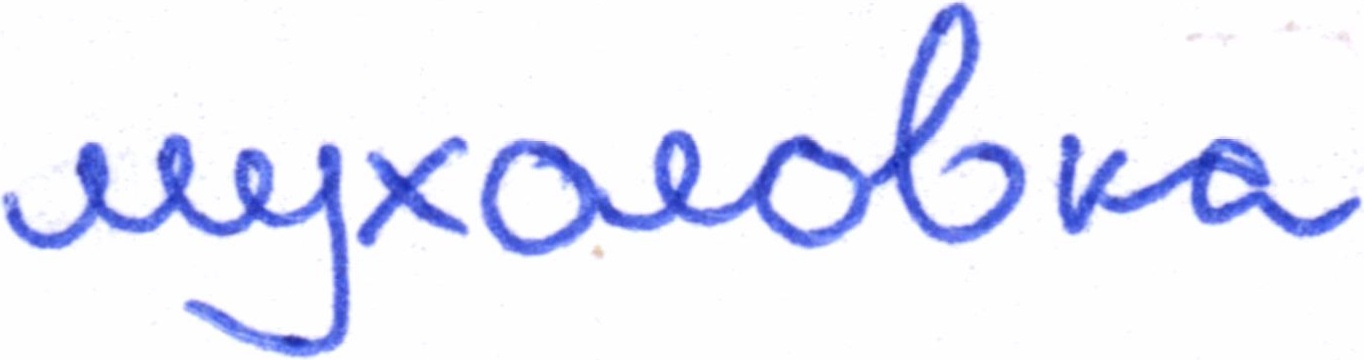мухоловка
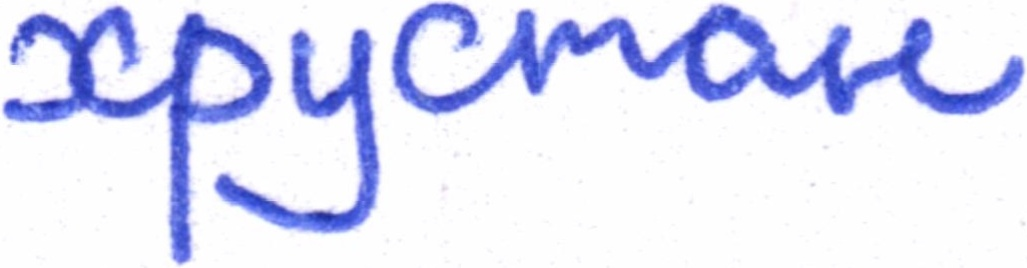хрустан
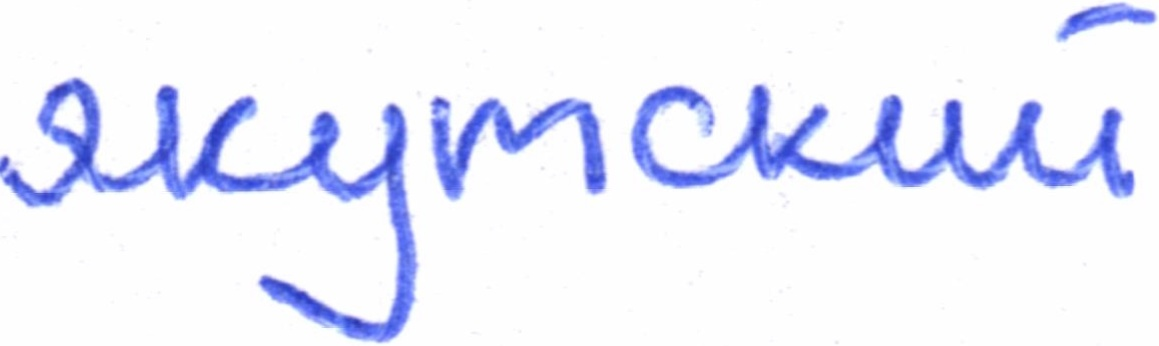якутский
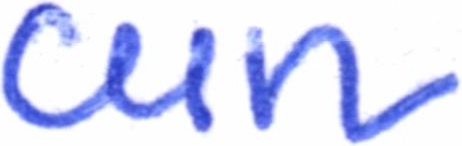сип
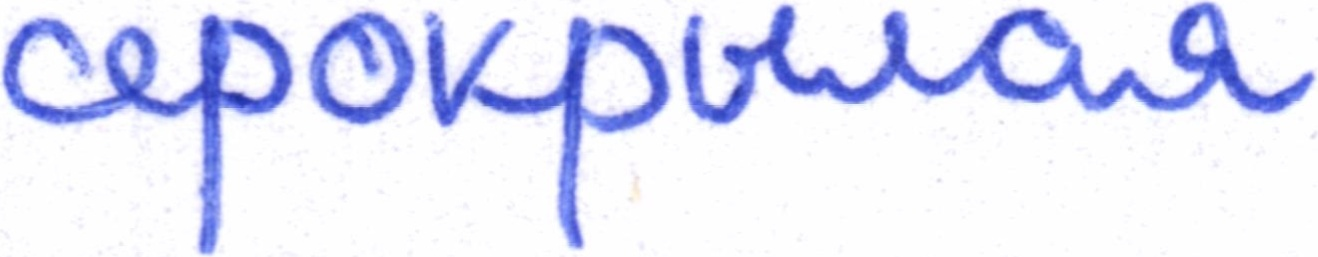серокрылая
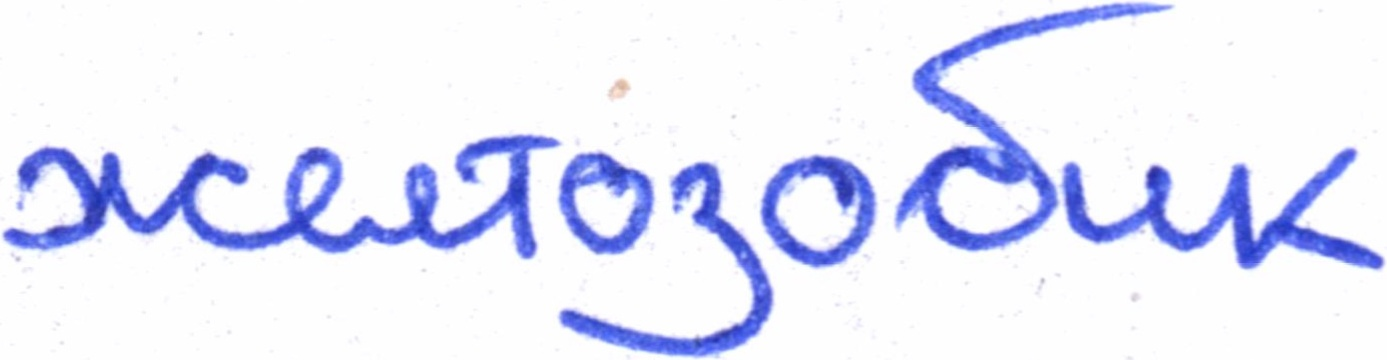желтозобик
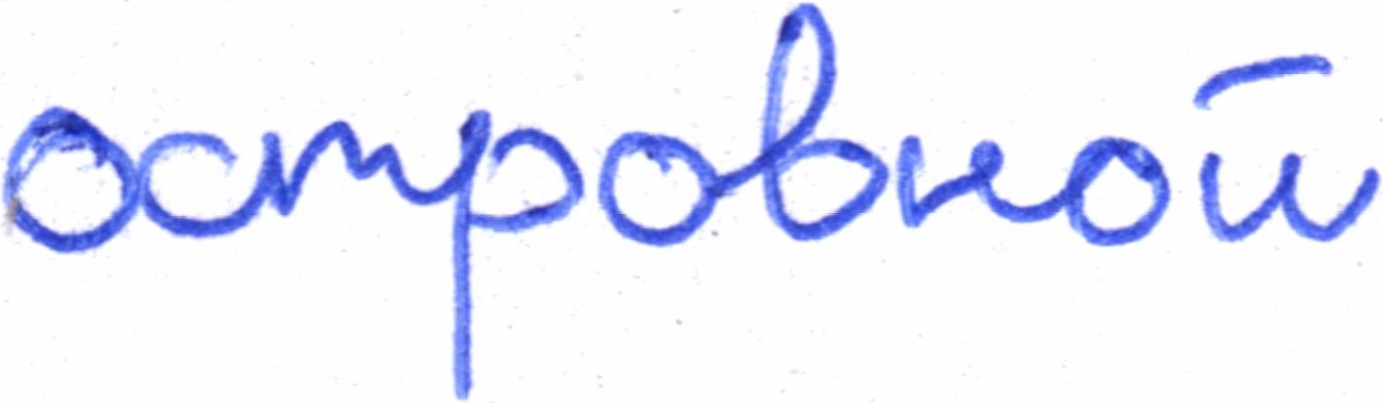островной
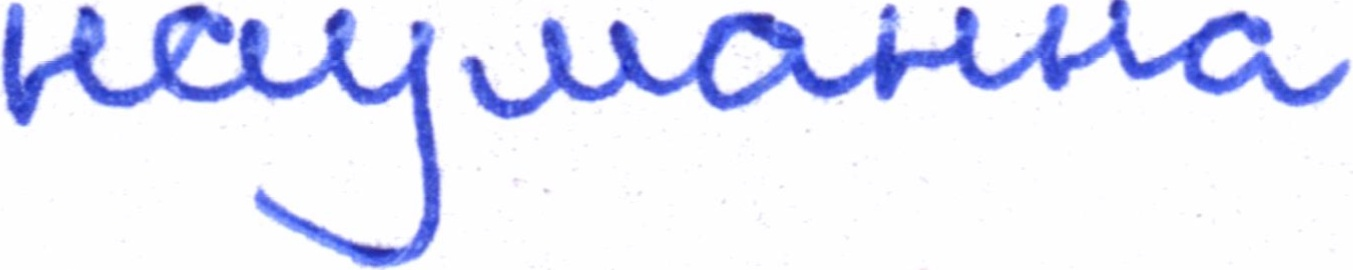науманна
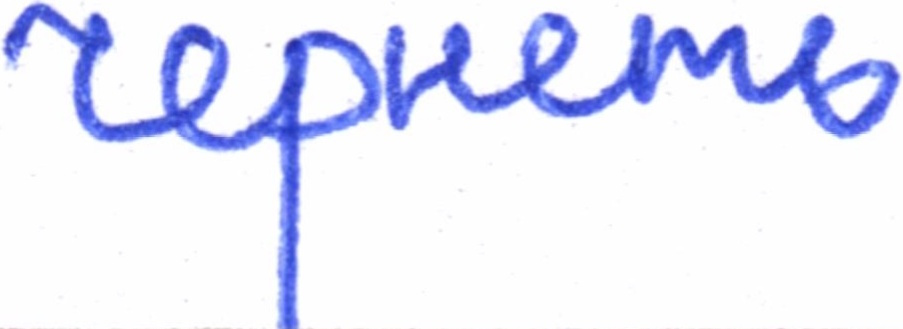чернеть
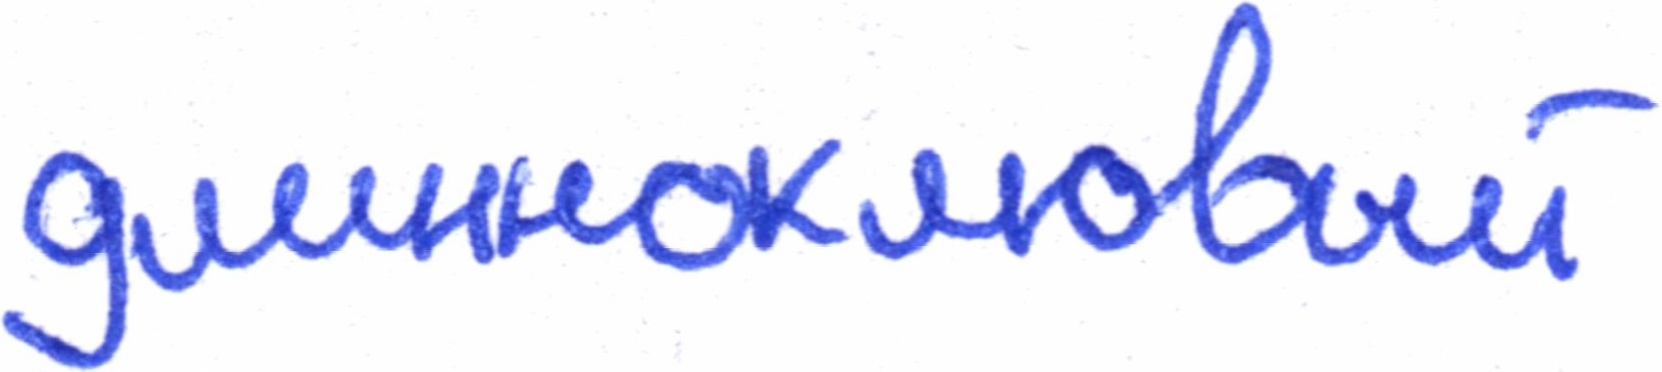длинноклювый
